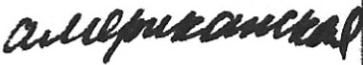американская
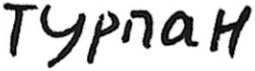турпан
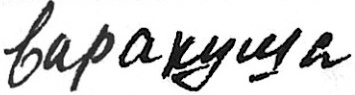варакуша
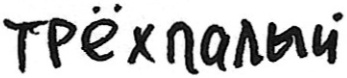трёхпалый
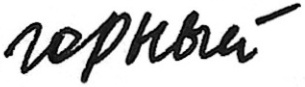горный
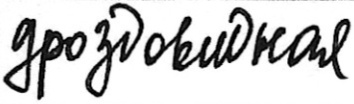дроздовидная
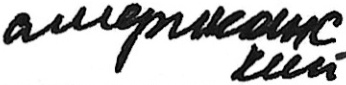американский
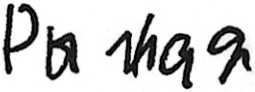ры жая
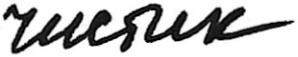чистик
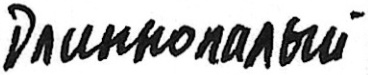длиннопалый
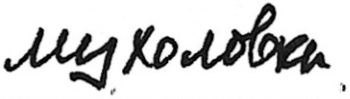мухоловка
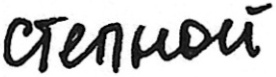степной
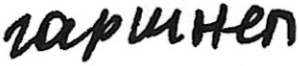гаршнеп
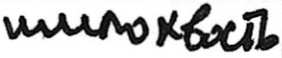шилохвость
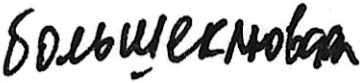большеклювая
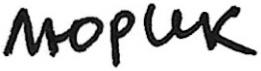люрик
